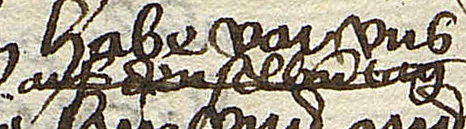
auf denſelb*n tag
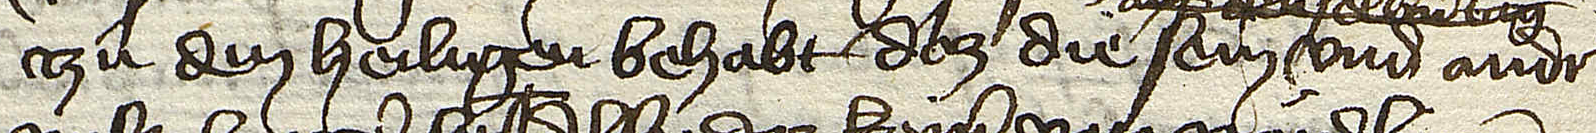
cʒu den heiligen behabt / daʒ die ſein vnd andr*
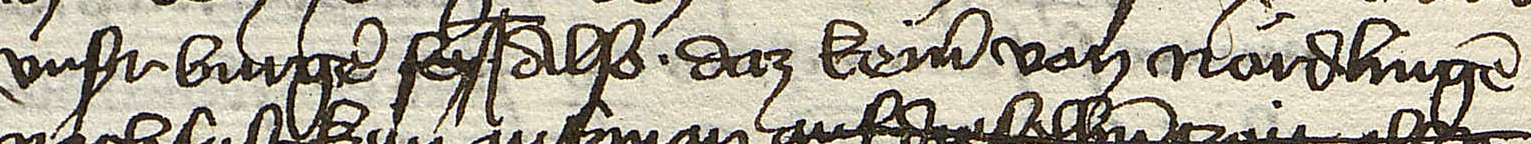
vnſ*r burge* ſey Alſo . daʒ kein* von Nördlinge*
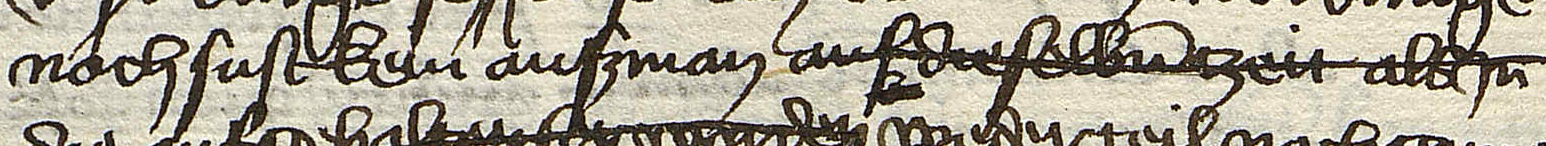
noch ſuſt kein auſʒman auf dieſelb*n cʒeit als In
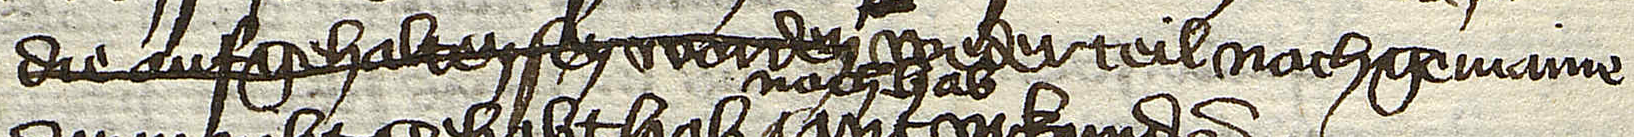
die aufgehalten ſey worden weder teil noch gemaine
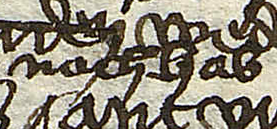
noch hab
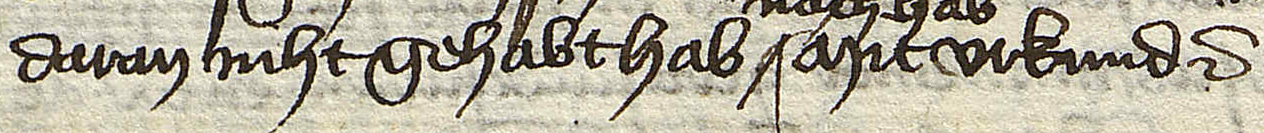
daran niht gehabt hab Mit vrkund ec*
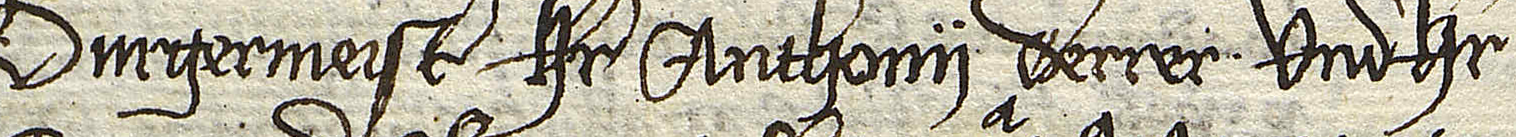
Burgermeiſt* H*r Anthonii Derrer . Vnd H*r
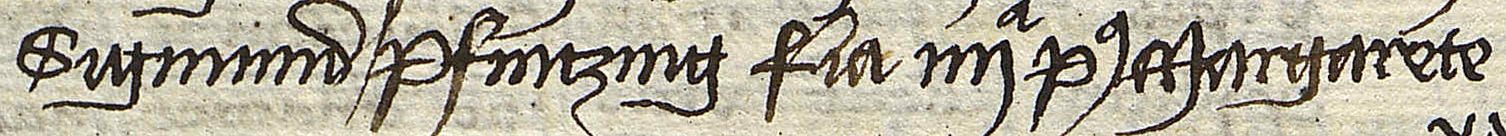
Sigmund Pfincʒing fia* iiii* P* Margarete
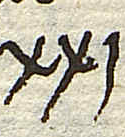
xxi*
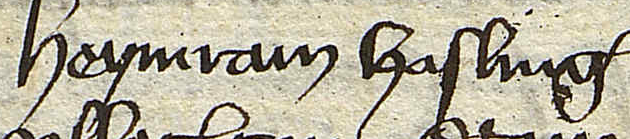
heymram haſling*
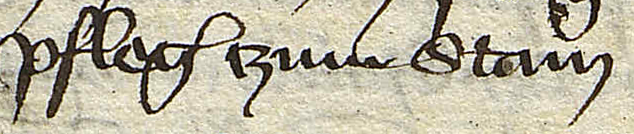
pfleg* cʒum Stain
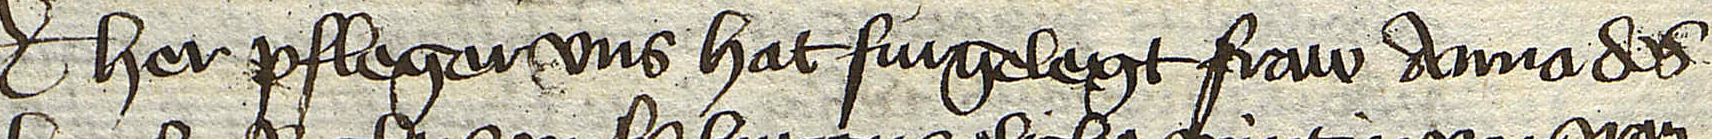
L* her pfleger vns hat fürgelegt fraw Anna des
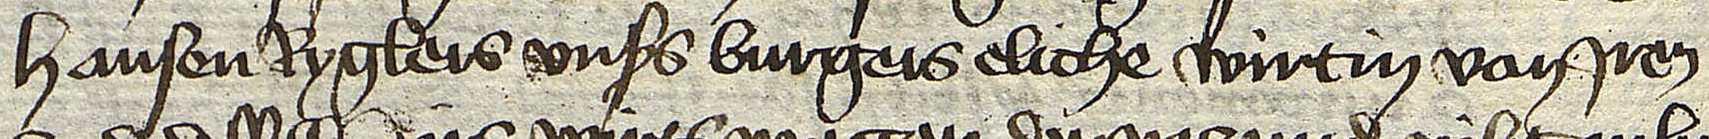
hanſen Ryglers vnſ*s burgers eliche wirtin von Iren
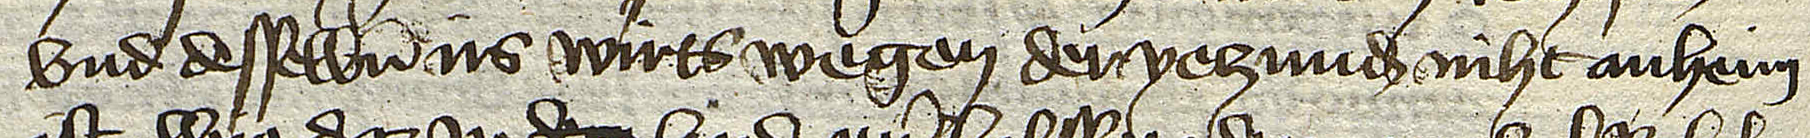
vnd deſſelb*n irs wirts wegen der yecʒund* niht anheim
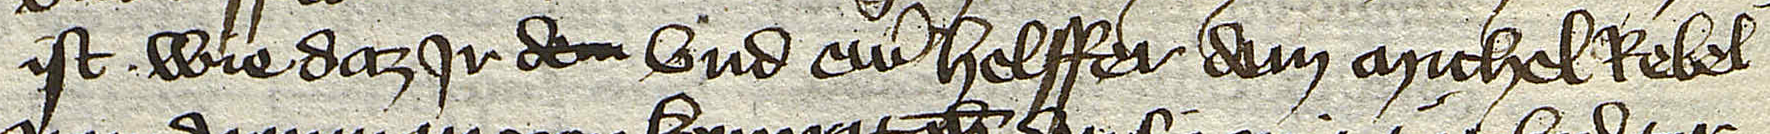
iſt . wie daʒ Ir dem vnd ew* helffer dem Michel Rebel
